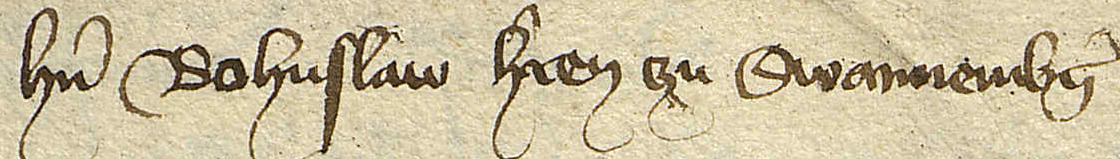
hn* Bohuſlaw h*ren cʒu Swannembg*
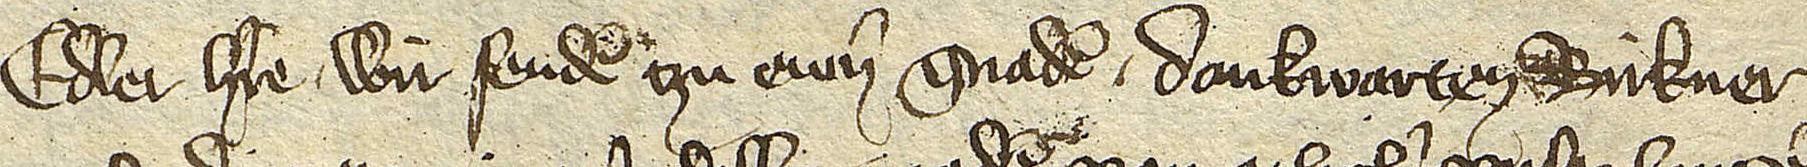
Edler h*re / wir ſende* cʒu ewn* gnade* / Dankwarten Birkner
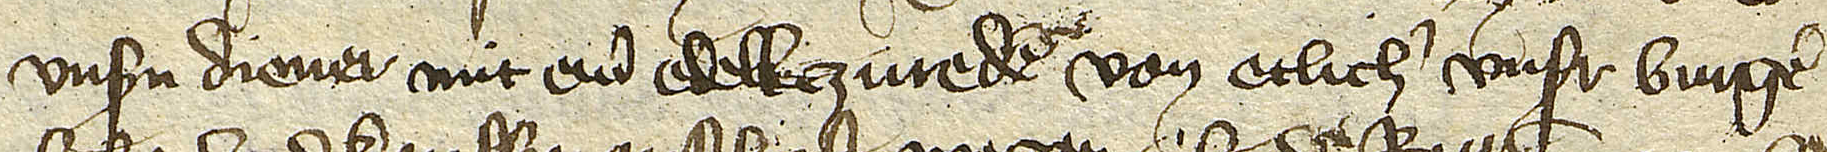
vnſ*n diener mit ew* edell cʒürede* von etlich* vnſ*r burge*
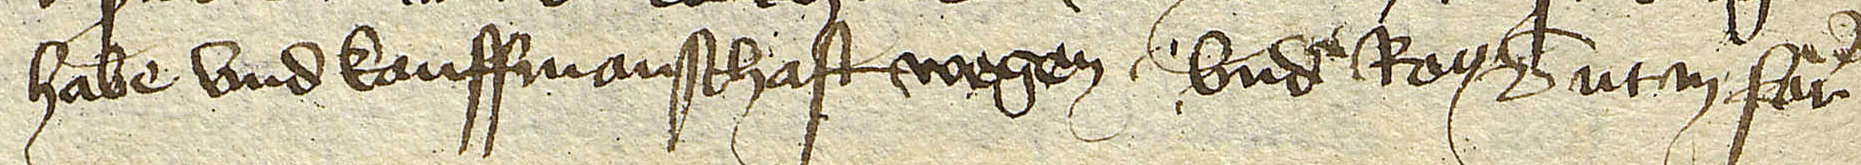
habe vnd kauffmanſchaft wegen / vnd Ro* ec*ut in for*
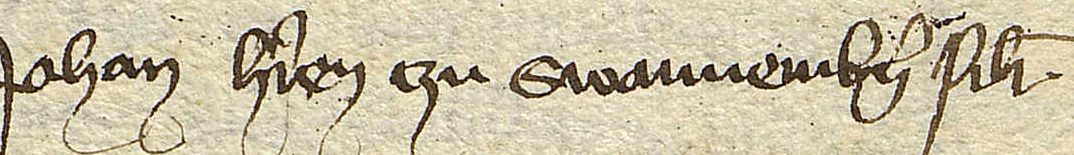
Iohan hr*en cʒu Swannembg* ſilr*
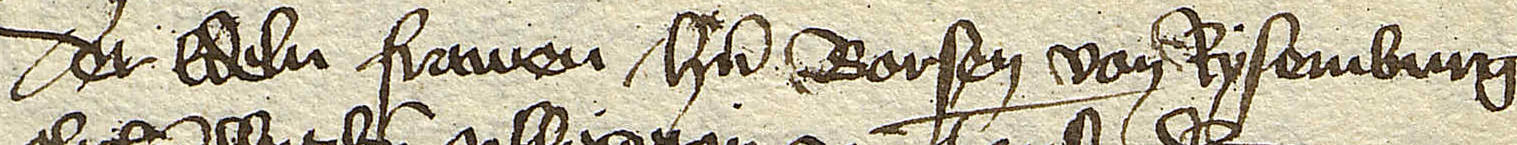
der Edeln frawen / hn* Borſen von Ryſemburg
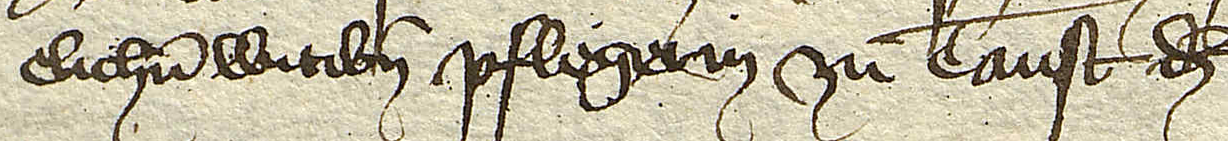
elichn* witibn* pflegerin cʒu Tauft d*
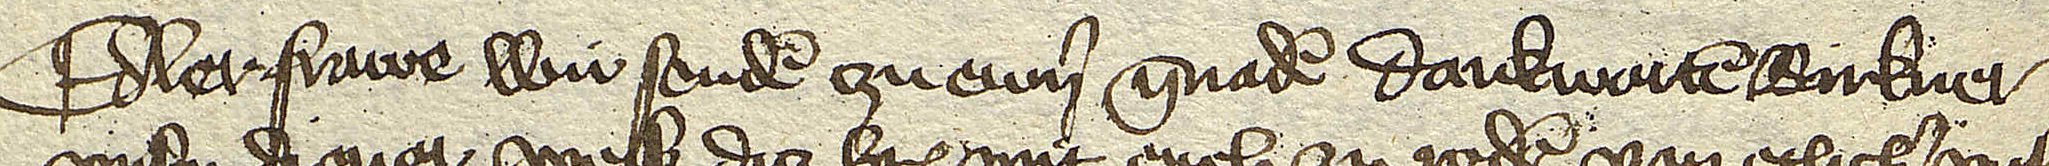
Edler frawe wir ſend* cʒu ewn* gnad* dankwarte* Birkner
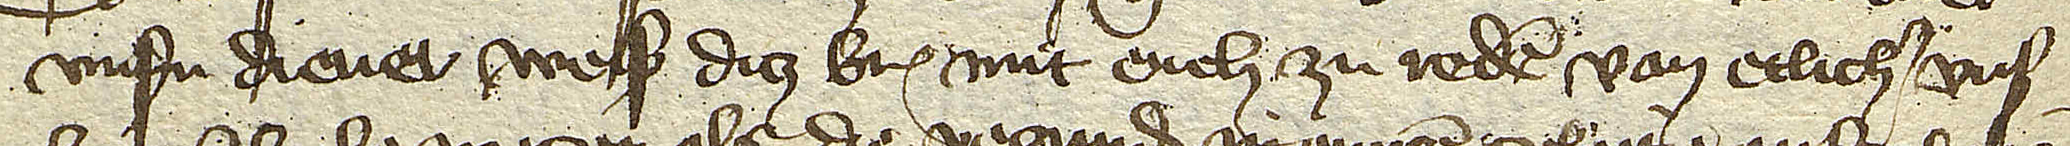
vnſ*n diener weiſ* dicʒ br* mit euch cʒu rede* von etlich* vnſ*
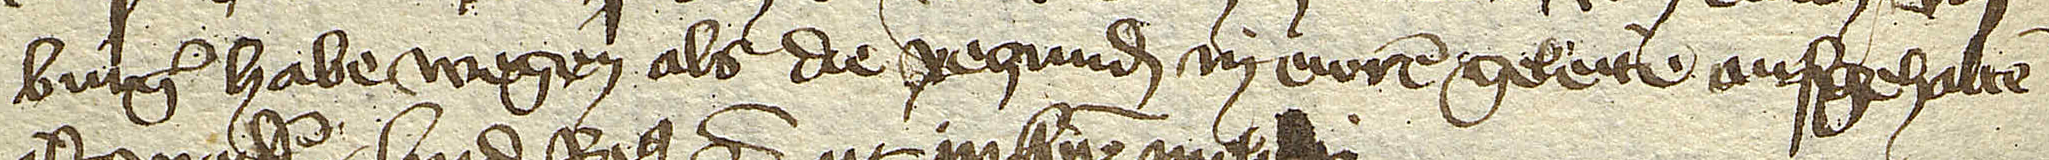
burg* habe wegen als die yecʒund* in ewre* geleite aufgehalte*
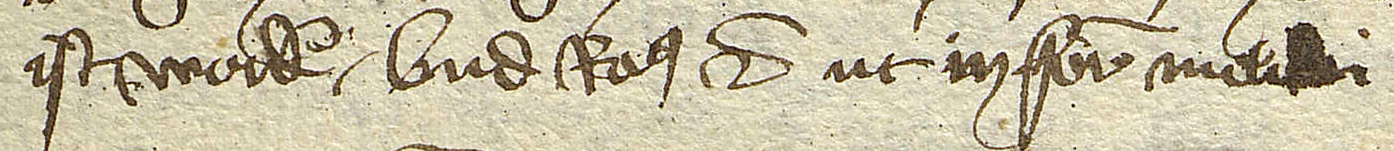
iſt word* / vnd Ro* ec* ut in for* meliori
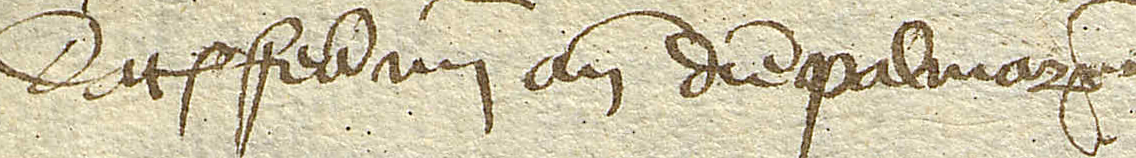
Dat* fea* iiii* an* die Palma*
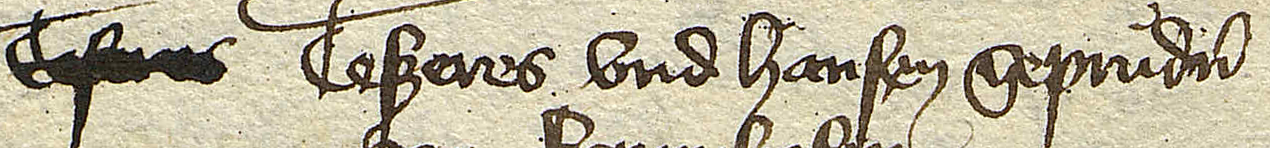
Teſeres Teſʒeres vnd hanſen geprüdn*
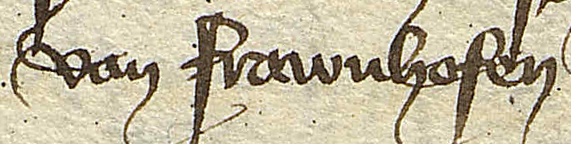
von frawenhofen
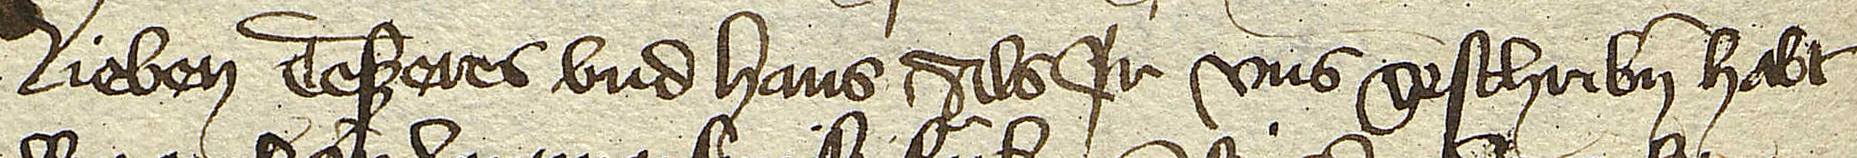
Lieben Teſʒeres vnd hans / Als Ir vns geſchribn* habt
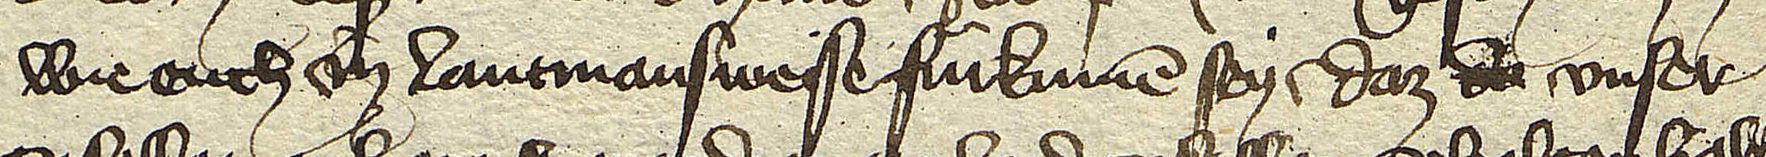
wie euch in Lantmanſweiſe fürkume* ſey / daʒ di vnſer
